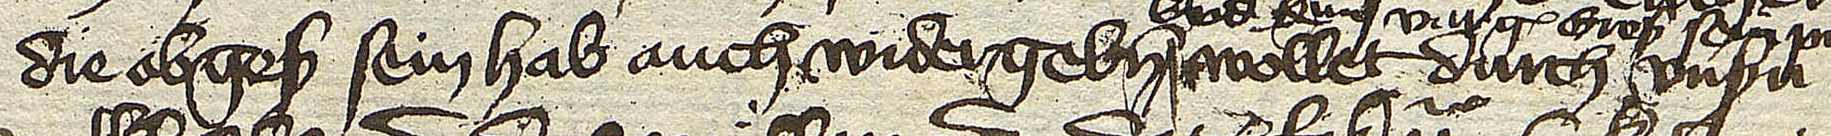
die obgeſ* ſein hab auch widergebn* wöllet durch vnſ*n
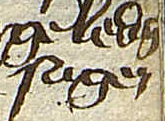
ſagen
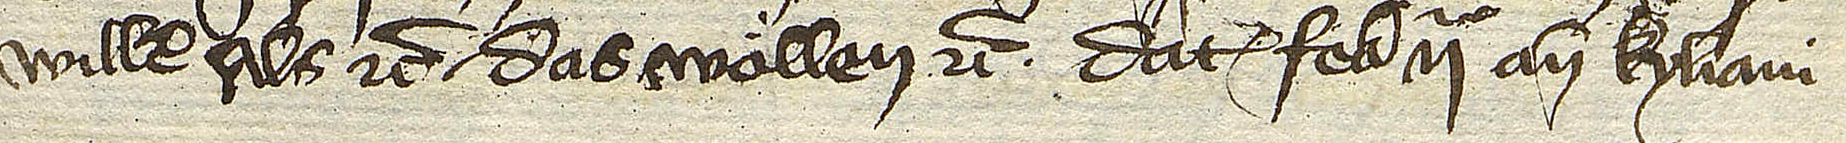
wille* Als ec* / Das wöllen ec* . Dat* fea* ii* an* kyliani
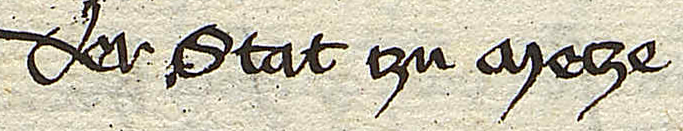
Der Stat cʒu Mecʒe
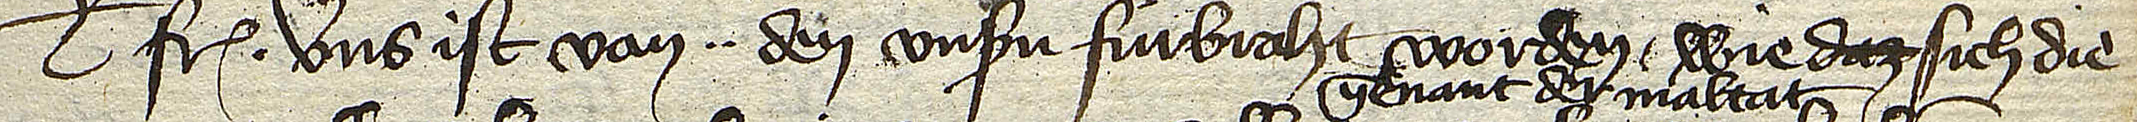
L* fr* Vns iſt von ~ den vnſn* fürbraht worden / wie daʒ ſich die
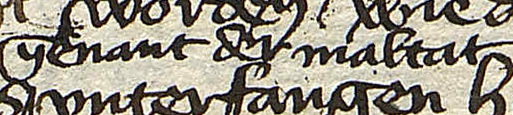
genant der maltat
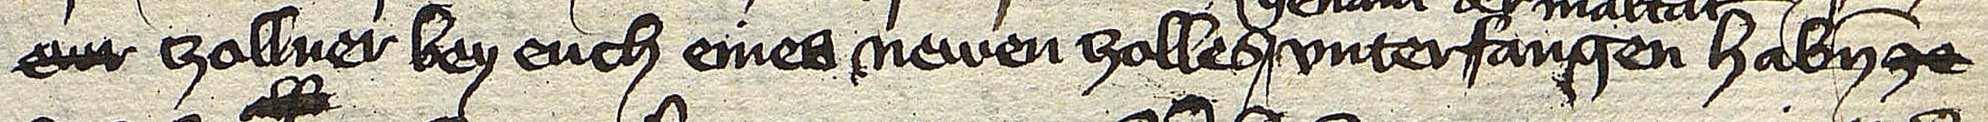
ewr cʒollner bey euch eines newen cʒolles vnterfangen habn* ʒe
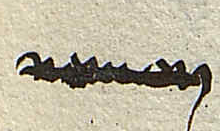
nemen
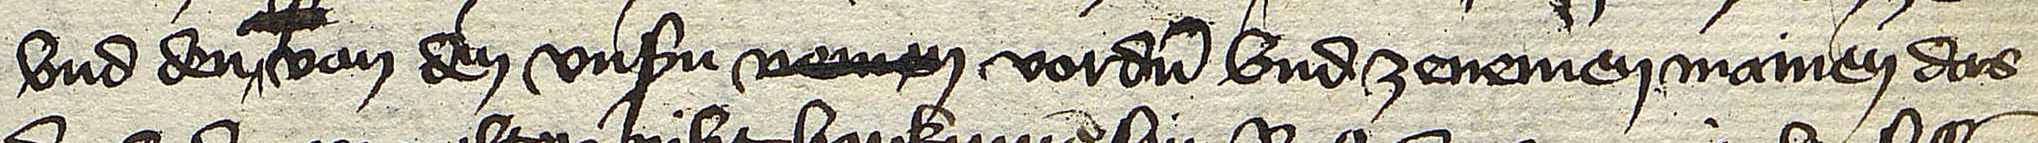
vnd den von den vnſn* nemen vordn* vnd cʒenemen mainen das
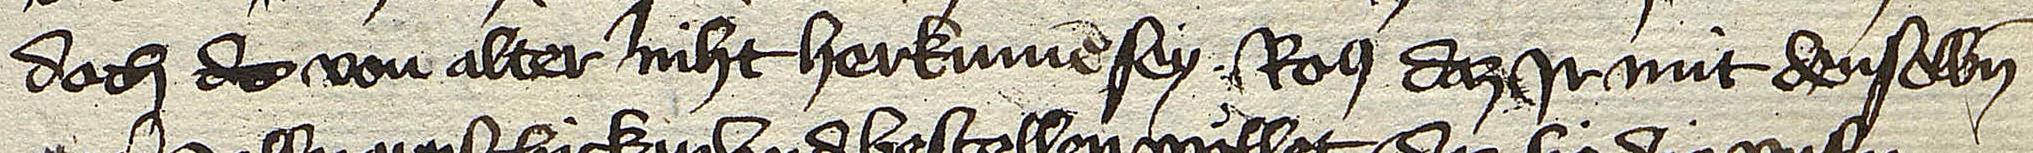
doch do von alter niht herkume* ſey . Ro* daʒ Ir mit denſelbn*
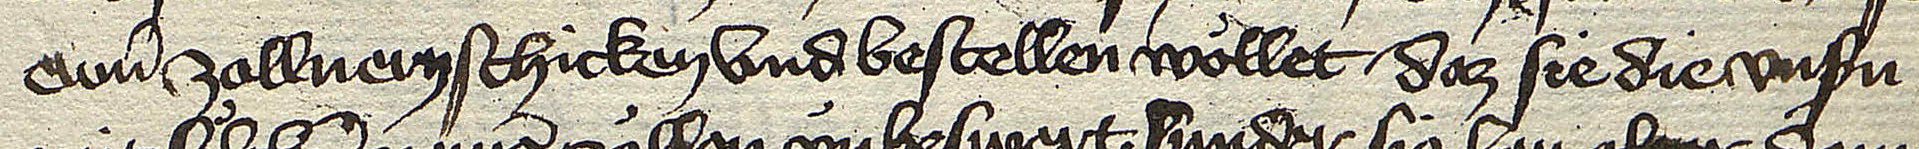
ewn* cʒollnern ſchicken vnd beſtellen wöllet / daʒ ſie die vnſn*
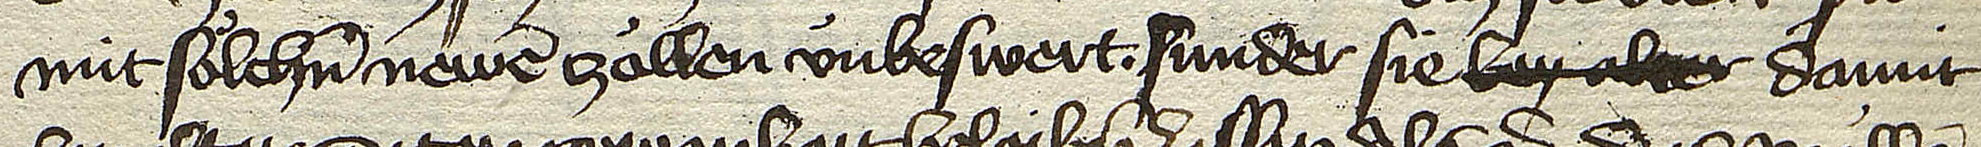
mit ſölchn* newe* cʒöllen v̈nbeſwert . ſunder ſie bey alter damit
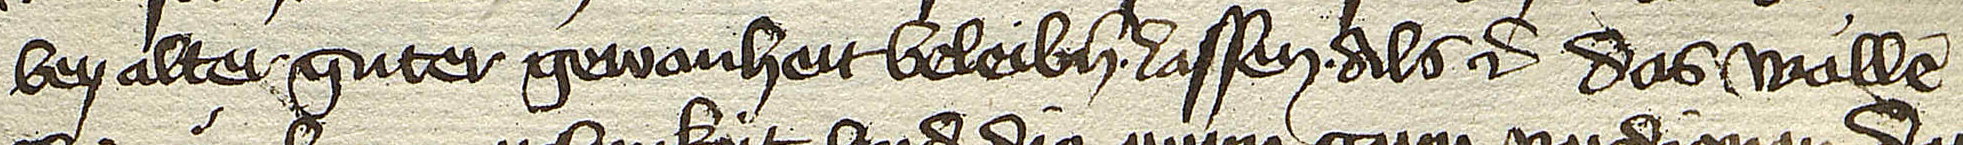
bey alter guter gewonheit beleibn* . laſſen . Als ec* das wölle*
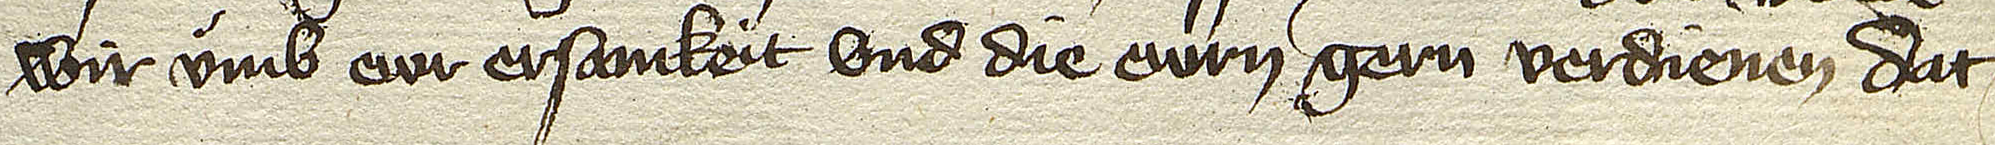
wir v̈mb ewr erſamkeit vnd die ewrn gern verdienen dat*
